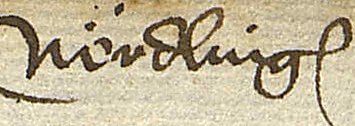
Nördling*
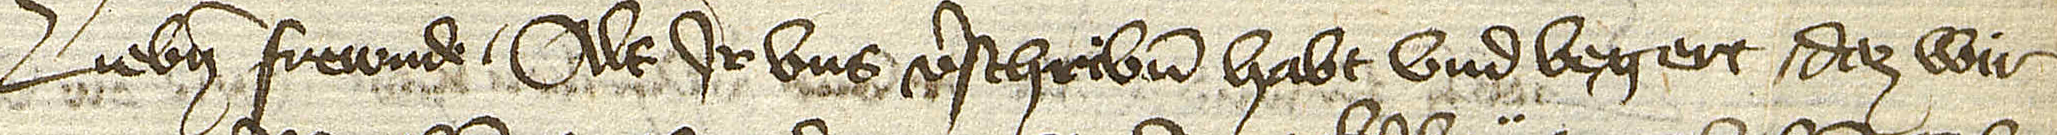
Liebn* frewnde / Als Ir vns v*ſchribn* habt vnd begert / daʒ wir
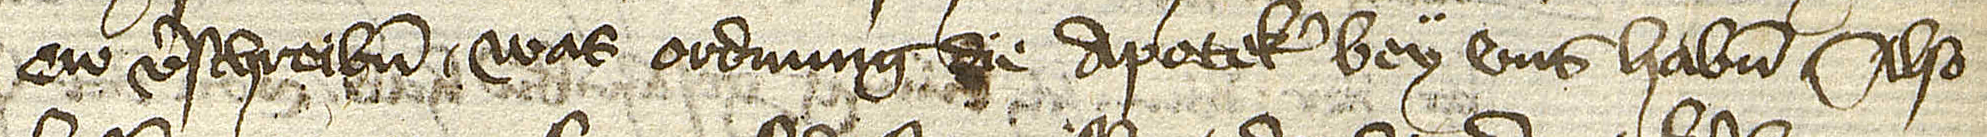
ew v*ſchreibn* / was ordnung die Apotek* bey vns habn* / Alſo
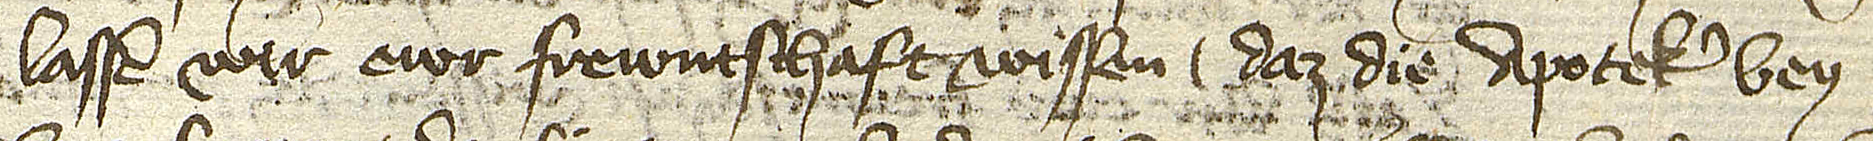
laſſe* wir ewr frewntſchaft wiſſen / daʒ die Apotek* bey
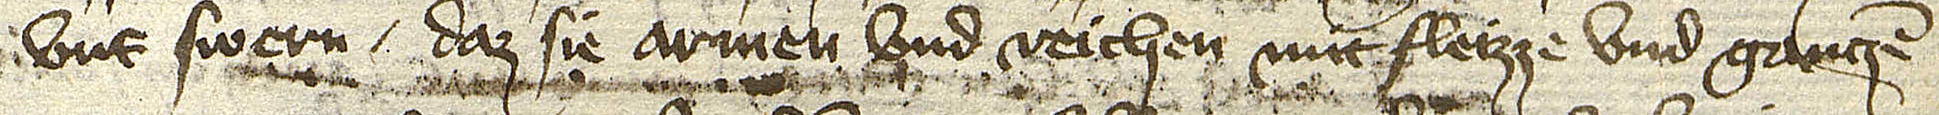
vns ſwern / daʒ ſie armen vnd reichen mit fleiʒʒe vnd gancʒe*
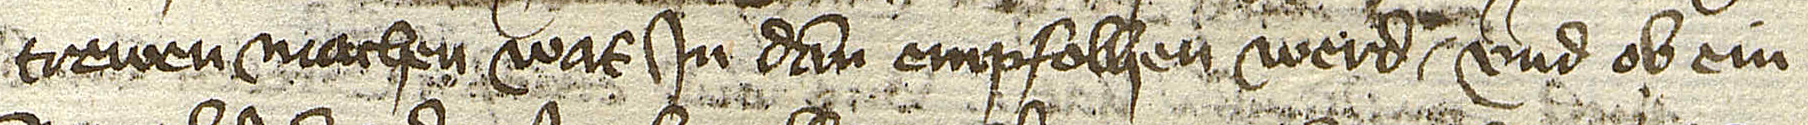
trewen machen was In dan* empfolhen werd / vnd ob ein
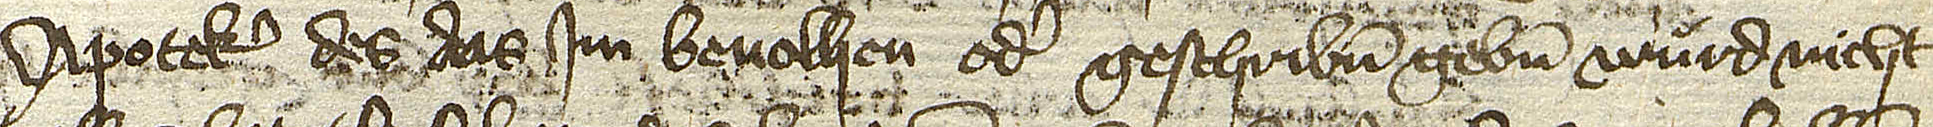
Apotek* des das Im beuolhen od* geſchribn* gebn* würd nicht
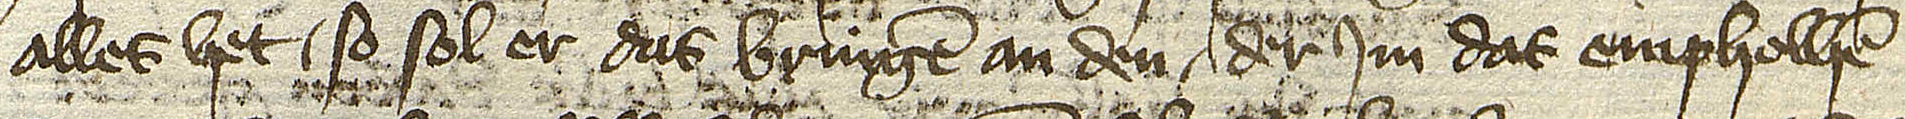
alles het ſo ſol er das bringe* an den / der Im das empholhe*
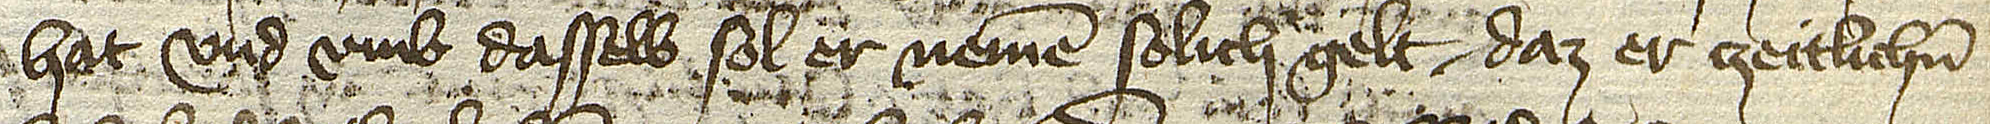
hat vnd vmb daſſelb ſol er neme* ſolich gelt / daʒ er cʒeitlichn*
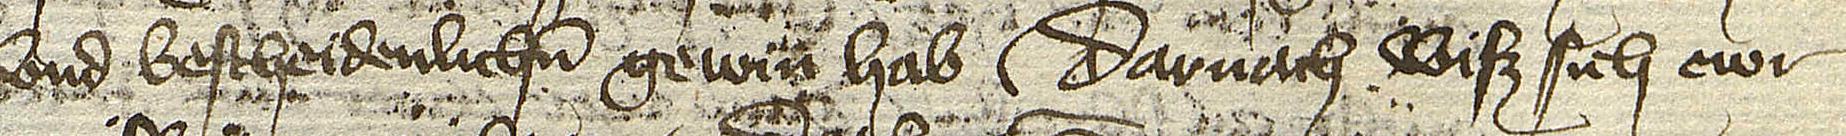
vnd beſcheidenlichn* gewin hab / Darnach wiſʒ ſich ewr
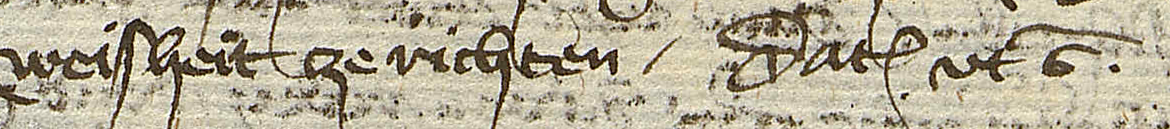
weiſheit cʒe richten / Dat* vt s* .
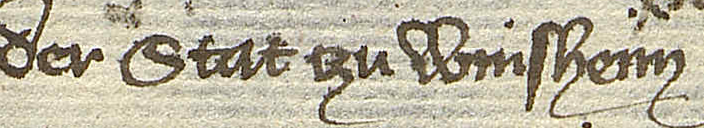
der Stat cʒu Winſheim
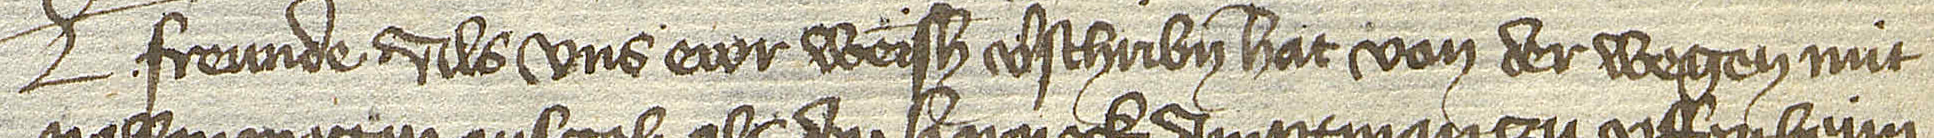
L* freunde / Als vns ewr weiſh* v*ſchribn* hat von der wegen mit
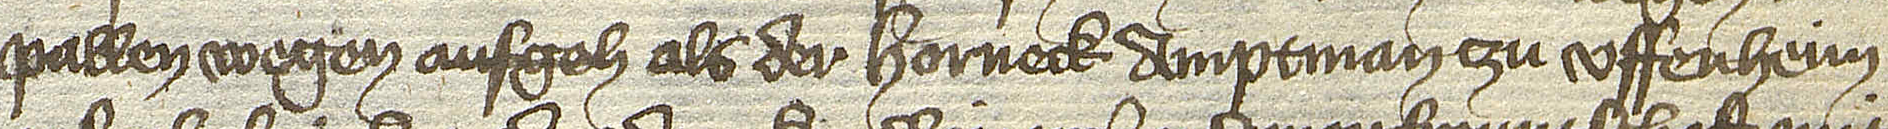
pallen wegen aufgeh als der horneck Amptman cʒu vffenheim
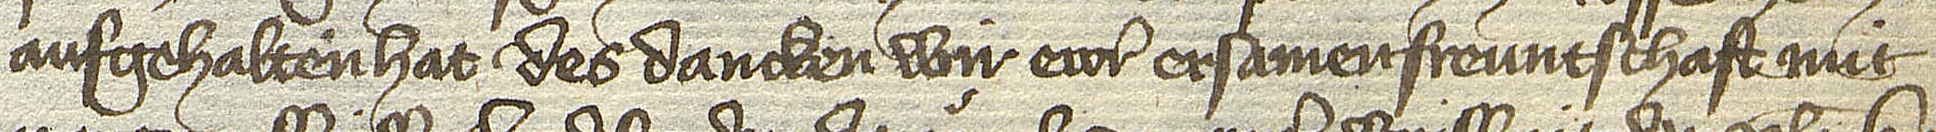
aufgehalten hat / des dancken wir ewr* erſamen freuntſchaft mit
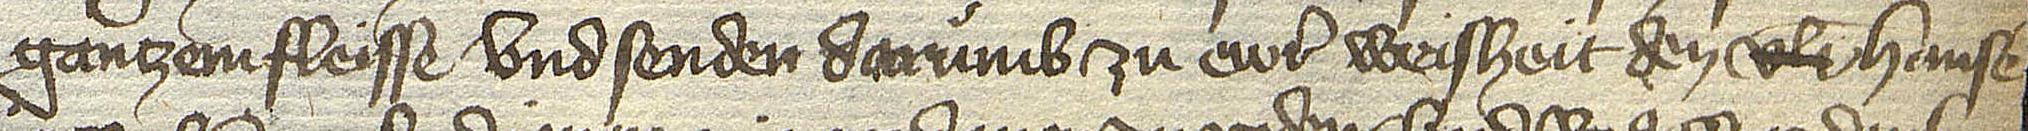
gancʒem fleiſſ / Vnd ſenden darümb cʒu ewr* weiſheit den vlr* hanſe*
